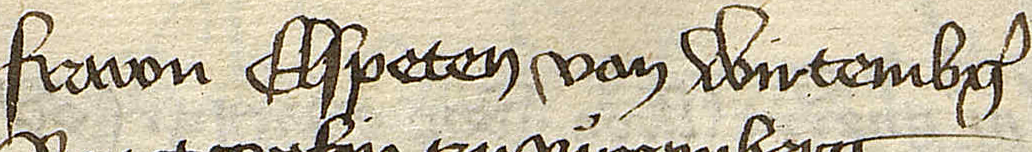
frawn Elſpeten von Wirtemb*g
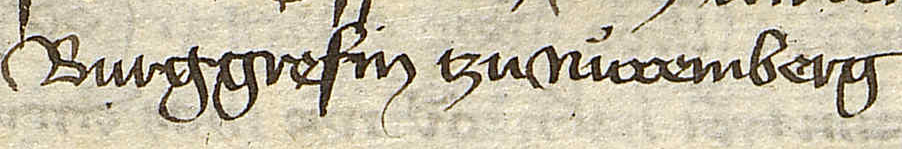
Burggrefin cʒu Nüremberg
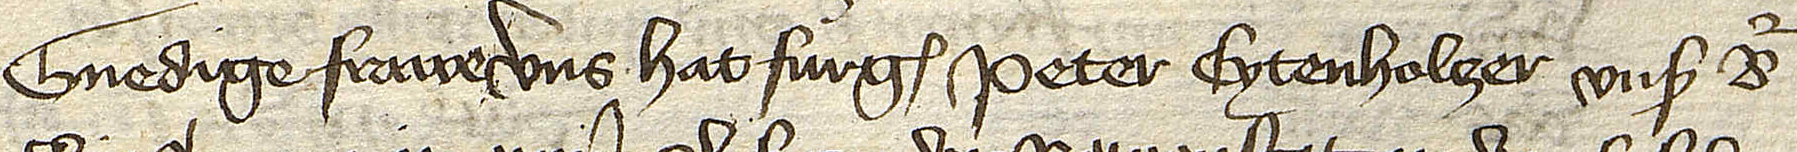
Gnedige frawe Vns hat fürg* Peter Eytenholcʒer vnſ* B*
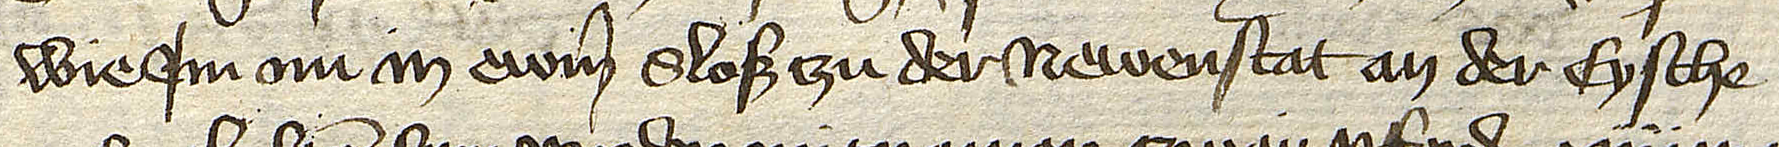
wie Im nu in ew*m Sloſʒ cʒu der Newenſtat an der Eyſche
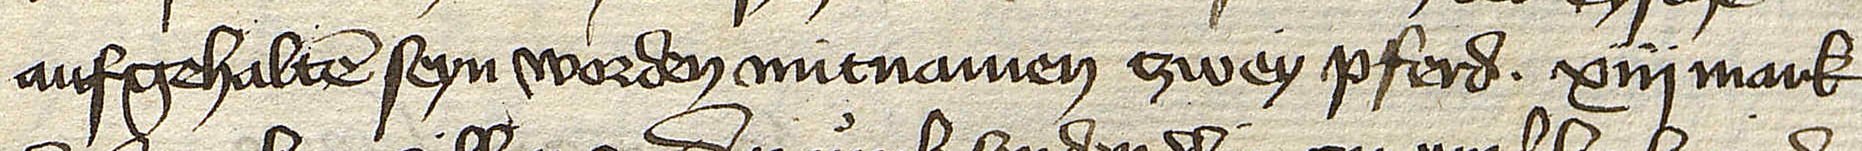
aufgehalte* ſeyn worden mitnamen cʒey pferd . xiii mark
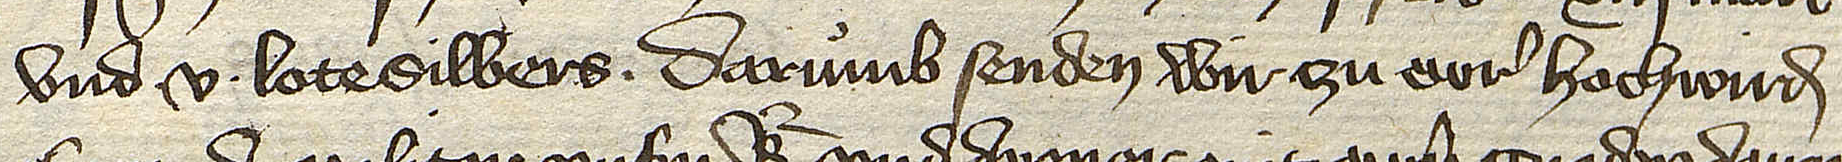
vnd v . lote Silbers . Darümb ſenden wir cʒu ewr* hochwird*
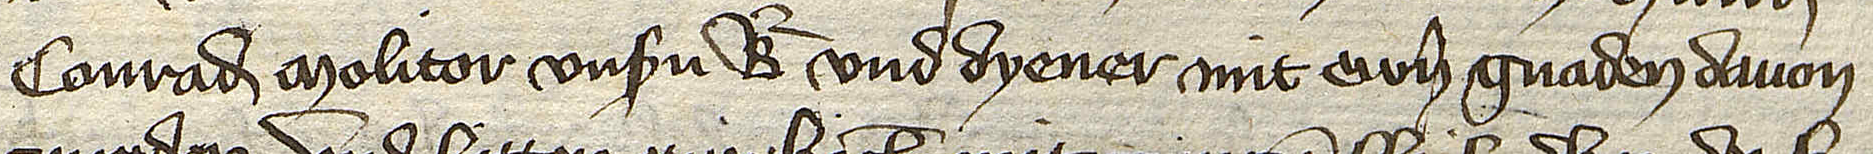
Conrad* Molitor vnſ*n B* vnd dyener mit ew*n gnaden dauon
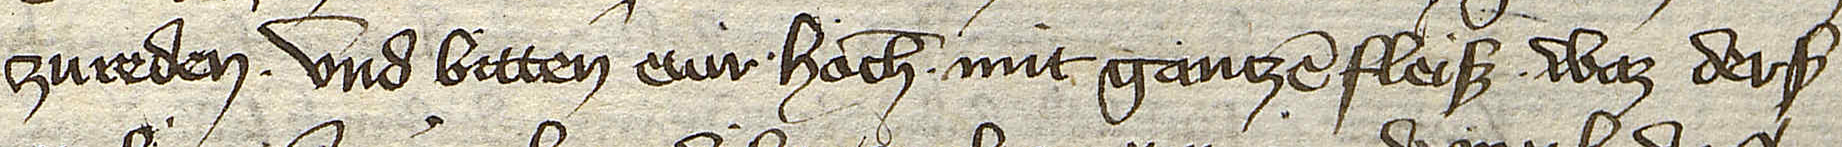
cʒureden . Vnd bitten ewr . hoch* . mit gancʒe* fleiſʒ . waʒ derſ*
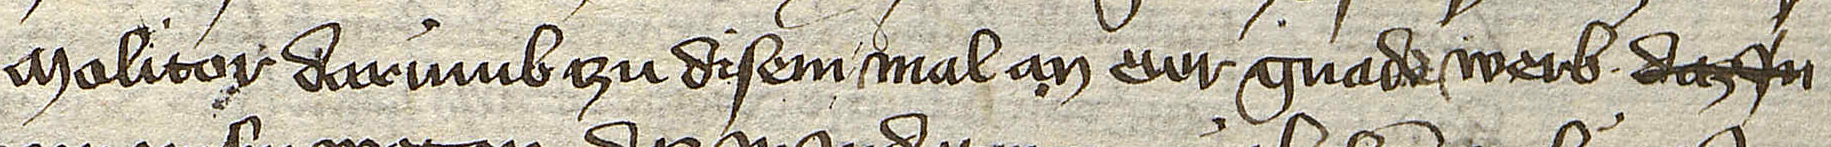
Molitor darümb cʒu diſem mal an ewr gnade werb . daʒ In
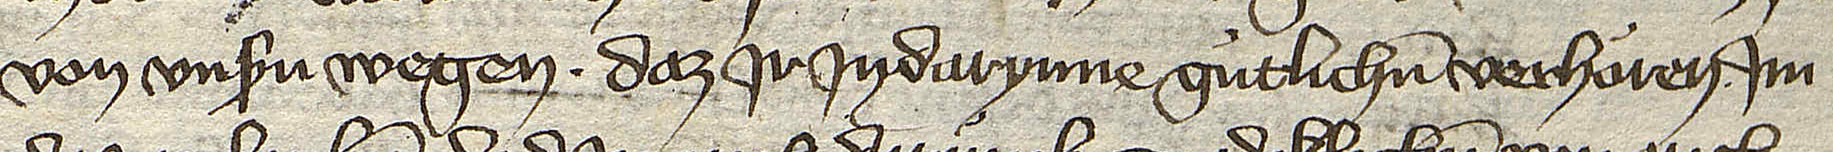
von vnſ*n wegen . daʒ Ir In darynne gütlichn* verhören . Im
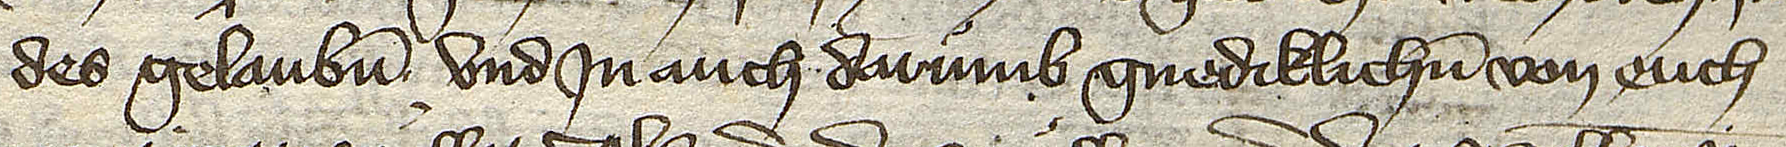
des gelaubn* . vnd In auch darümb gnediklichn* von euch
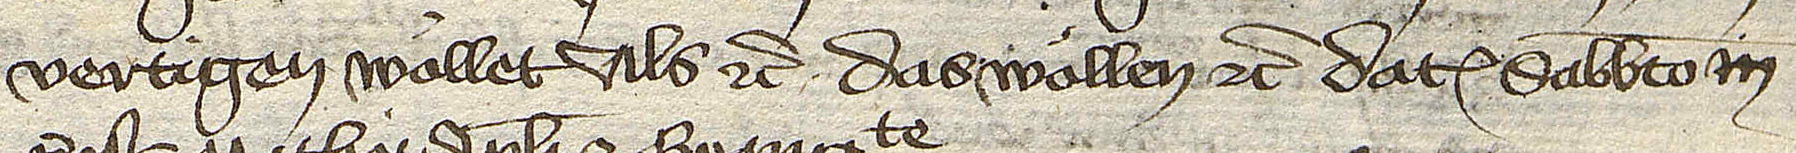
vertigen wöllet Als ec* Das wöllen ec* Dat* Sabbto* in
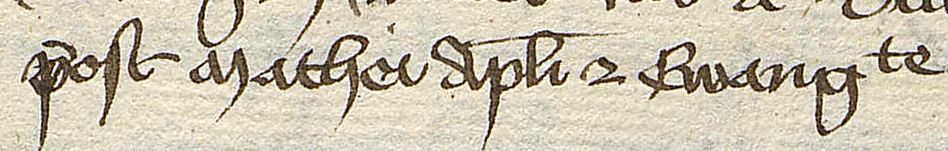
poſt Mathei Apli* @ Ewang*
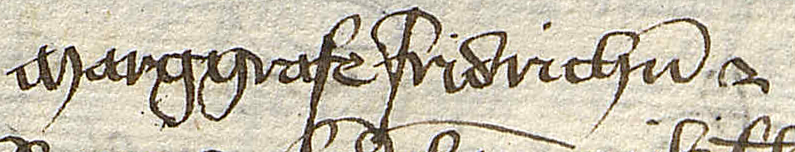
Marggrafe Fridrichn* @
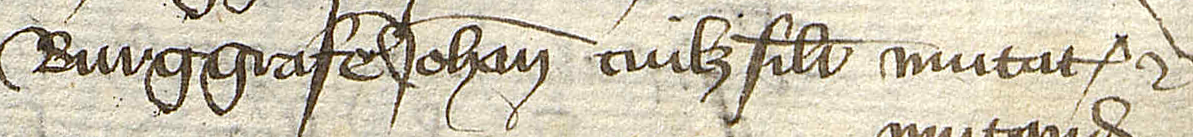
Burggrafe* Iohan* cuil* ſilr* mutat* ec*
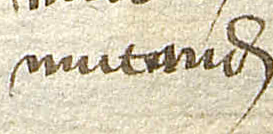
mutand*
